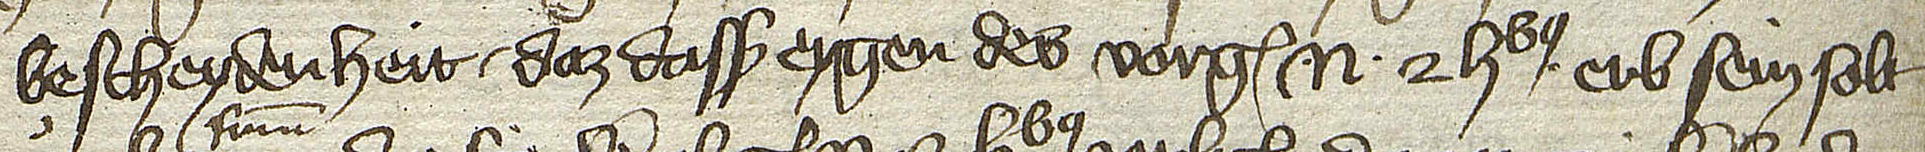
beſcheydenheit / daʒ daſſ* eygen des vorg* . N . @ h* . erb ſein ſolt
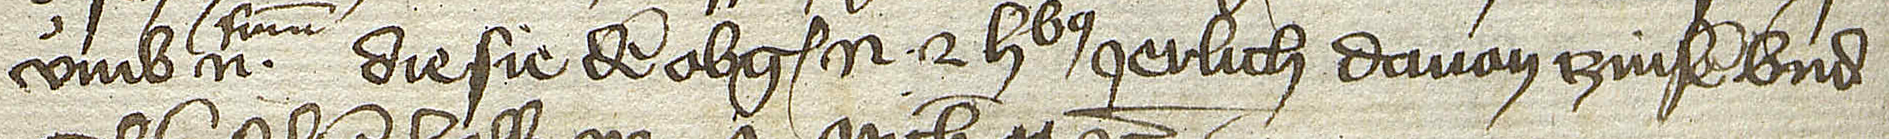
v̈mb N . die ſie de* obg* N . @ h* Ierlich dauon cʒinſe* vnd
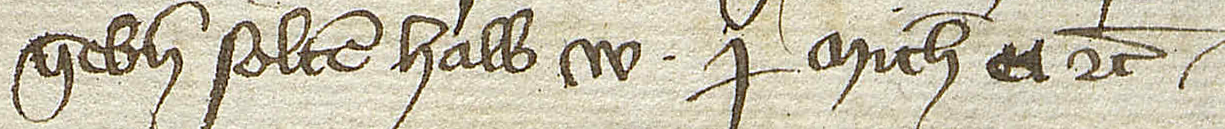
gebn* ſolte* halb w . I* Mich* et ec* /
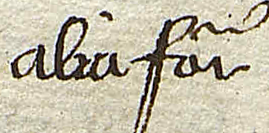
alia for*
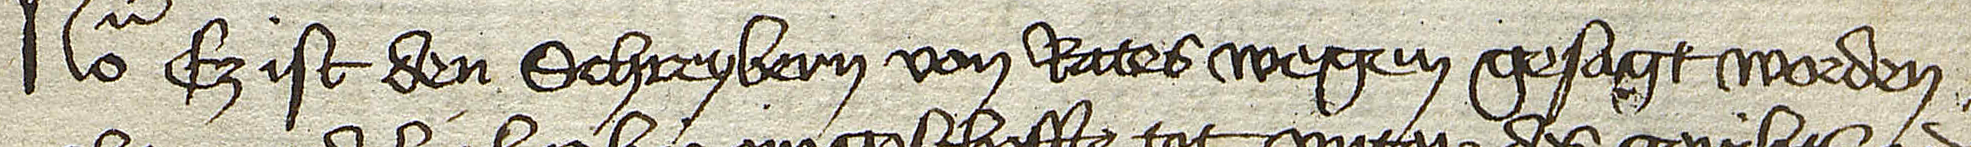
No* Eʒ iſt den Schreybern von Rates wegen geſagt worden
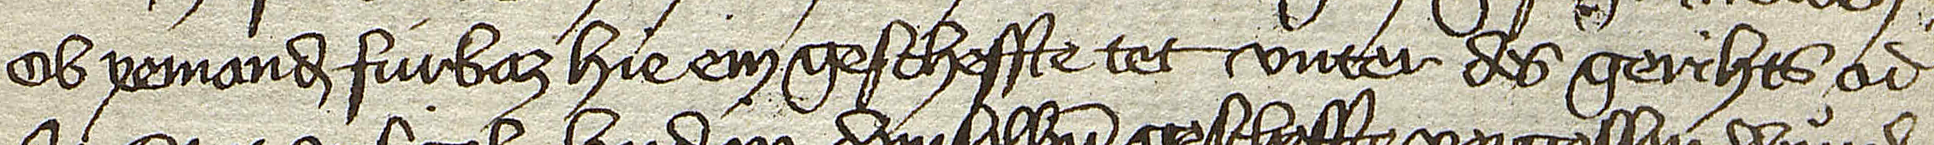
Ob yemand* fürbaʒ hie ein geſcheffte tet vnter das gerihts od*
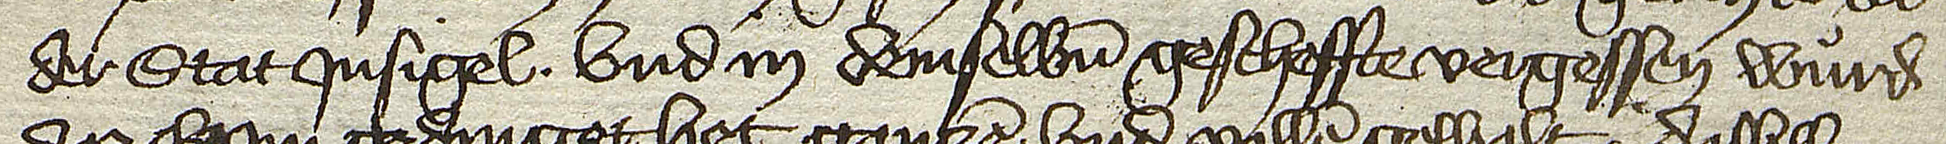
der Stat Inſigel . vnd in demſelb*n geſcheffte vergeſſen würd
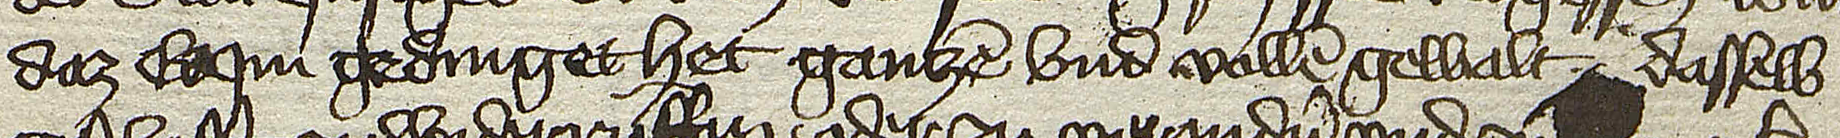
daʒ Es Im gedinget het gancʒe* vnd volle* gewalt . daſſelb
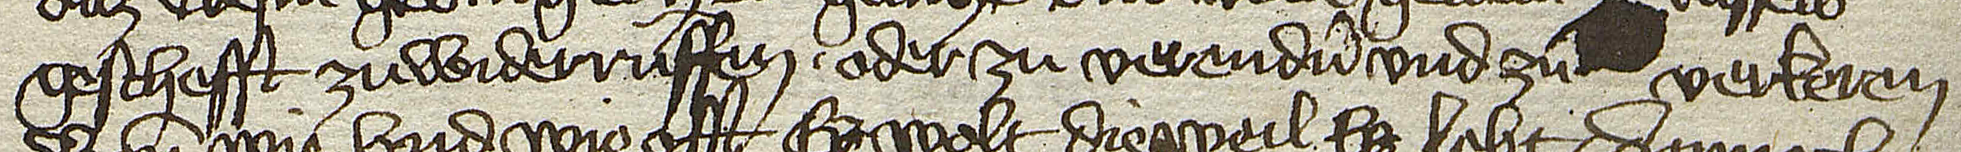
geſchefft ʒuwiderrüffen . oder cʒu verend*n vnd ʒu verkeren
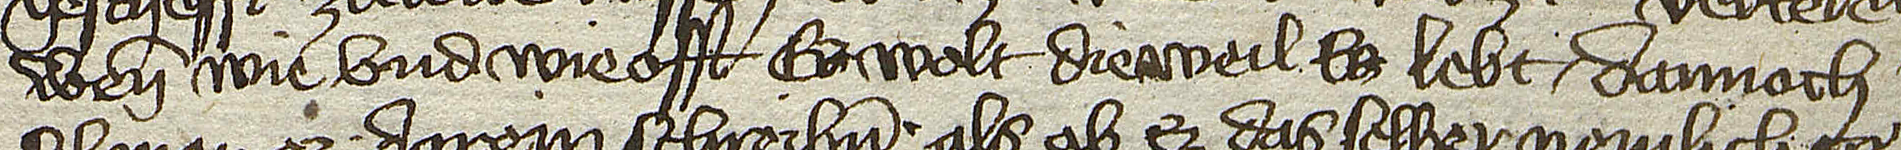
weg* wie vnd wie offt Es wolt dieweil Es lebt / Dannoch
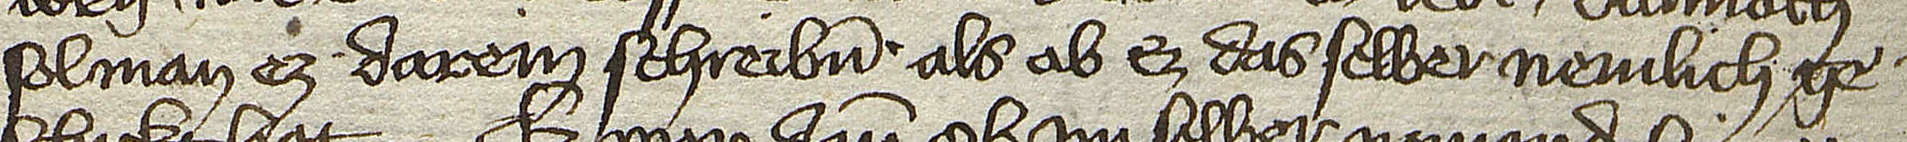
ſol man eʒ . darein ſchreib*n . als ob eʒ das ſelber nemlich ge -
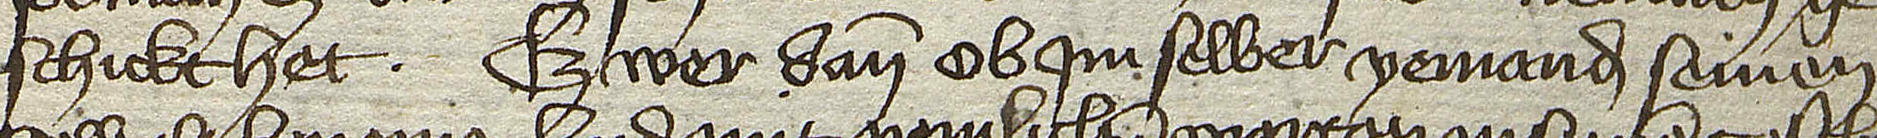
ſchickt het . Eʒ wer dan* Ob Im ſelber yemand* ſeinen
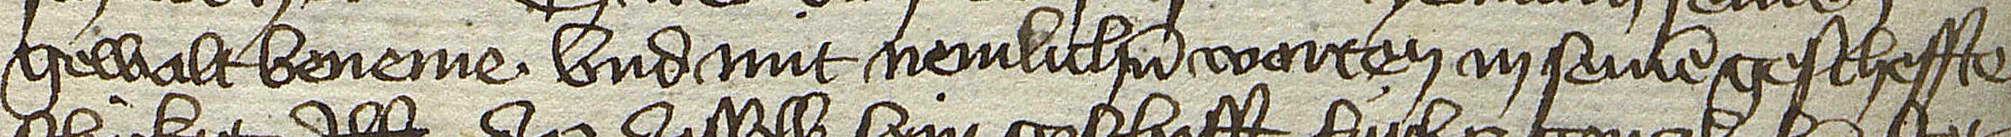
gewalt beneme . Vnd mit nemlich*n worten in ſeine* geſcheffte
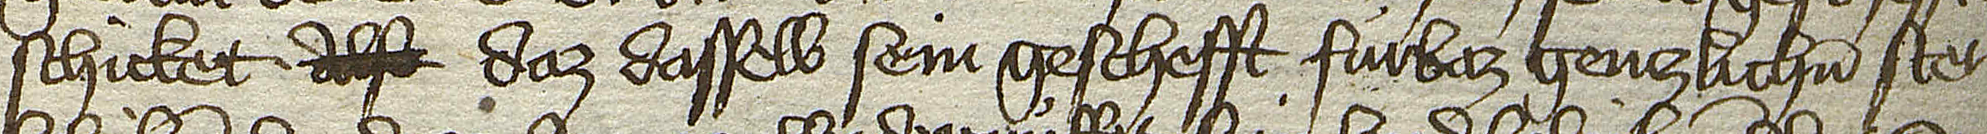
ſchiket . Alſo daʒ daſſelb ſein geſchefft fürbaʒ gencʒlich*n ſtet
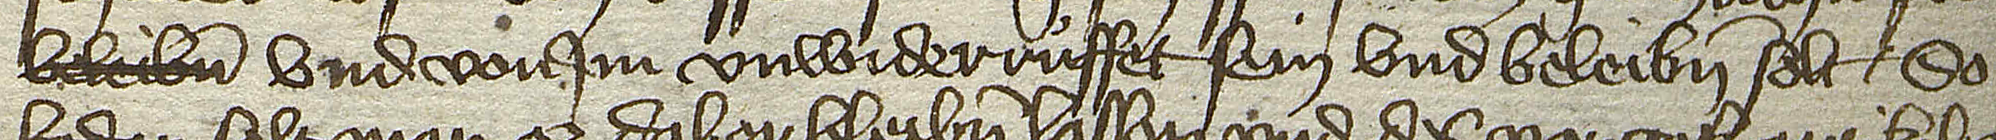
beleib*n Vnd von Im vnwiderrüffet ſein vnd beleib*n ſolt / So
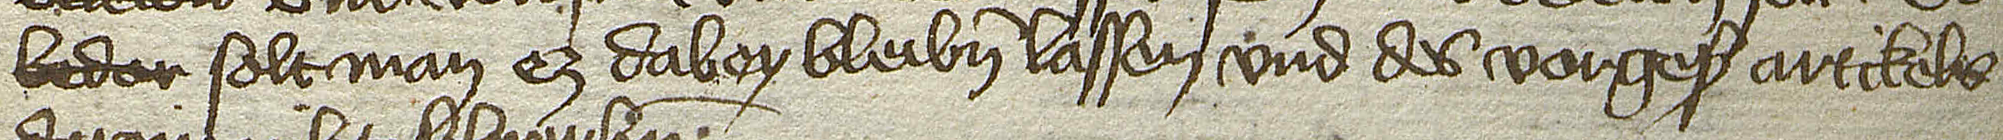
bedar ſolt man eʒ dabey bleib*n laſſen vnd das vorgeſ* artickels
